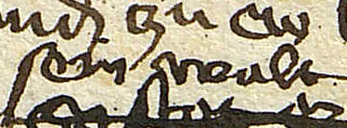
ſein wolt
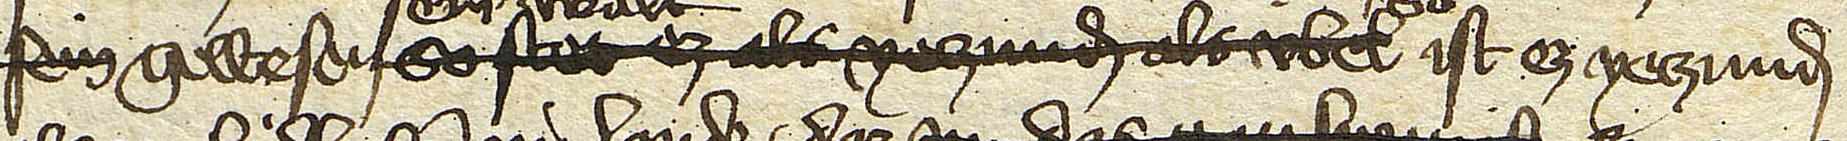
ſein geweſen So ſtet eʒ als yecʒund* als v̈bel iſt eʒ yecʒund*
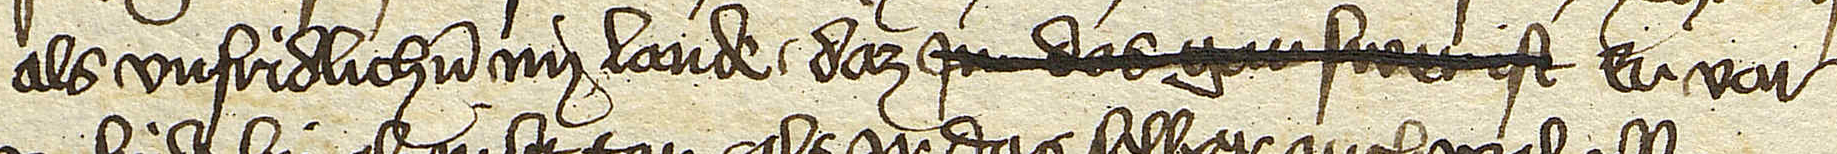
als vnfridlichn* im lande / daʒ Im das gar ſwer iſt Er vor
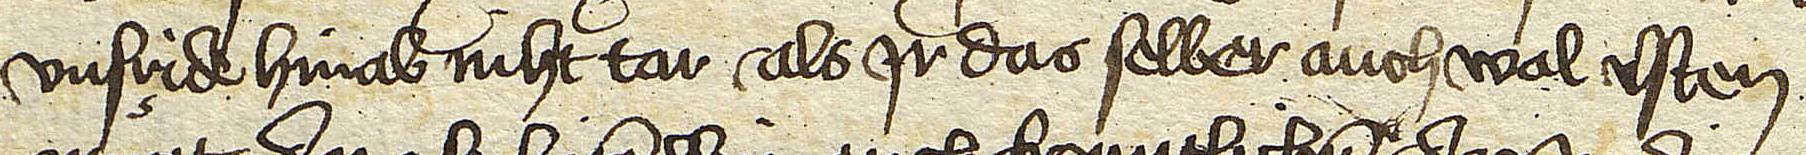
vnfride hinab niht tar / als Ir das ſelber auch wol v*ſten
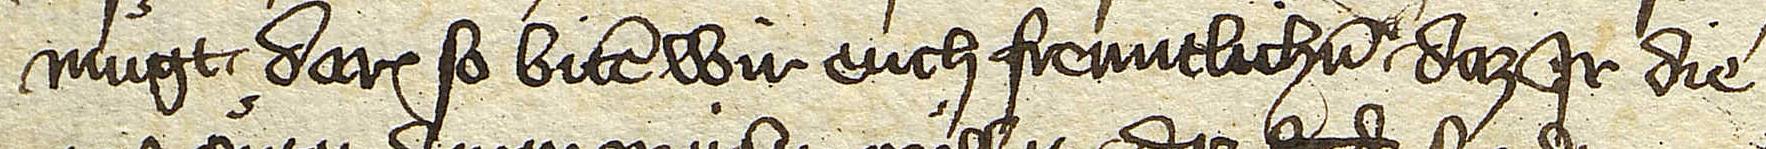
mügt / Dar* ſo bite* wir euch freuntlichn* / daʒ Ir die
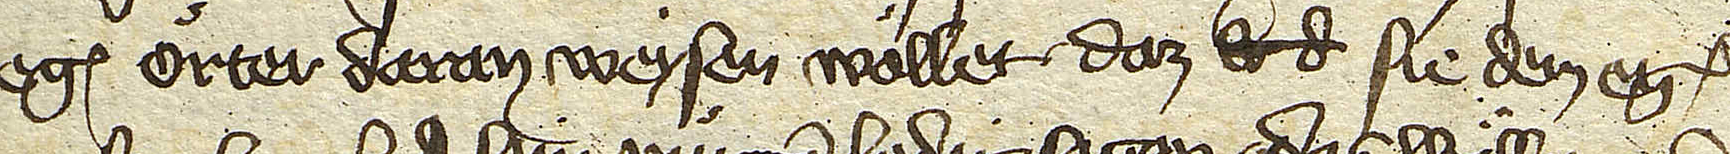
eg* Örter daran weyſen wöllet / daʒ Er d ſie dem eg*
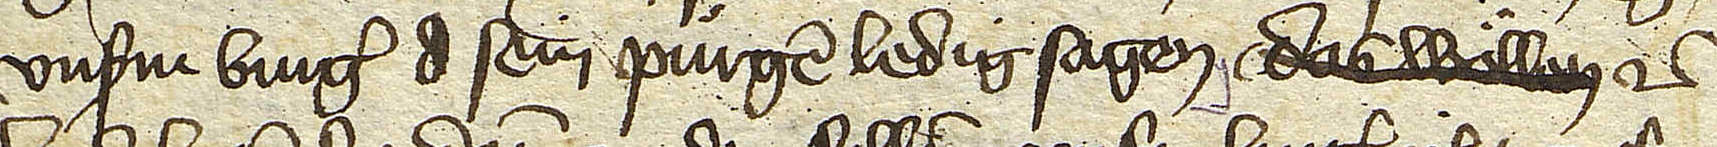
vnſ*m burg* d ſein pürge* ledig ſagen / das wöllen ec*
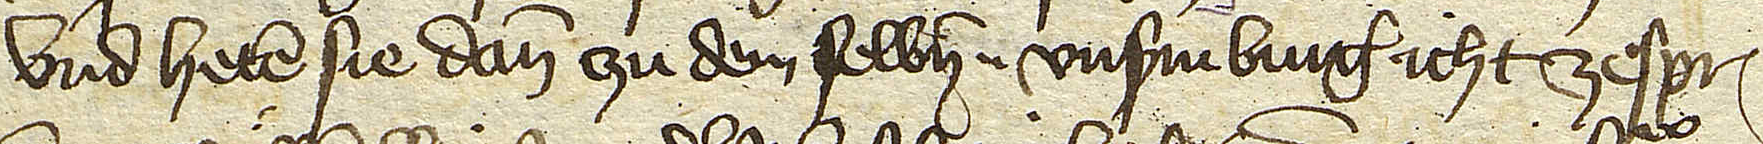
vnd hete* ſie dan* cʒu dem ſelbn* ~ vnſ*m burg* icht cʒeſpr*
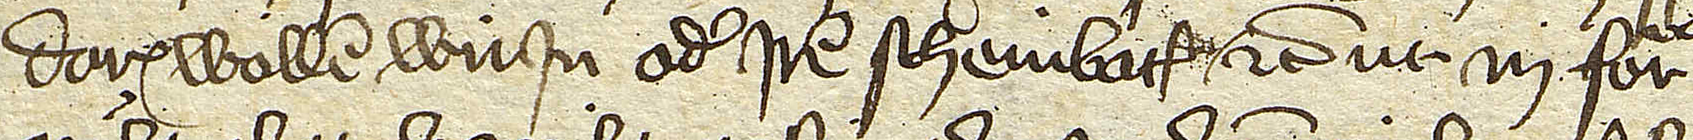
dar* wölle* wir In od* Ire* ſcheinbot* ec* ut in for*
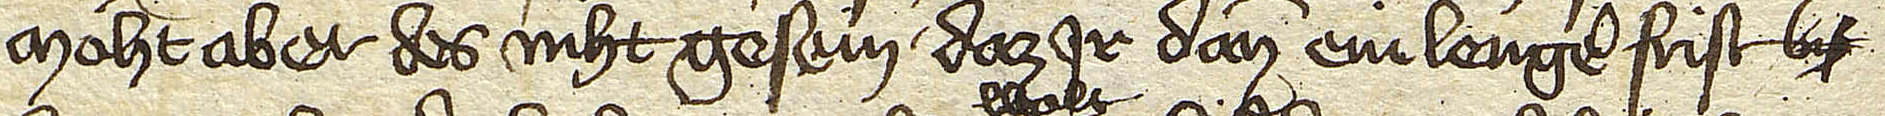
Möht aber des niht geſein / daʒ Ir dan* ein lenge* friſt biſʒ
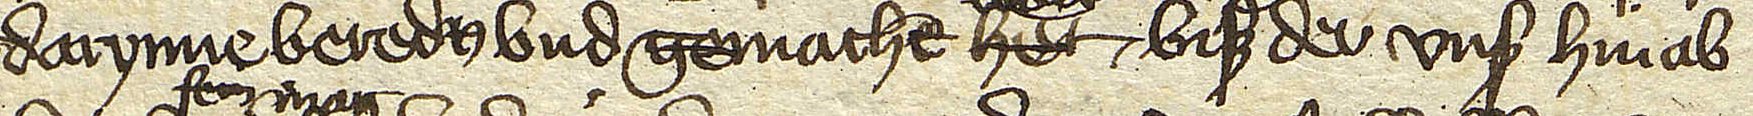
darynne beredt* vnd gemacht* het / biſʒ der vnſ* hinab
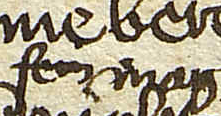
ſein mag
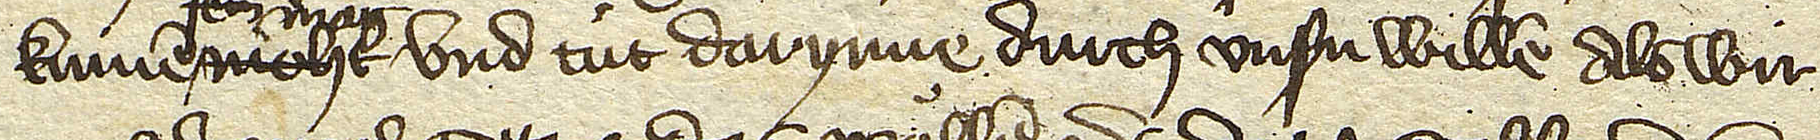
kume* moht / vnd tüt darynne durch vnſ*n wille* Als wir
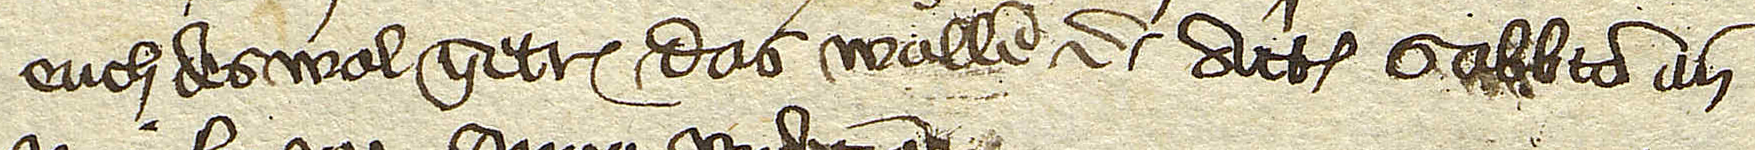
euch des wol getr* / das wölle ec* / Act* Sabbto* an*
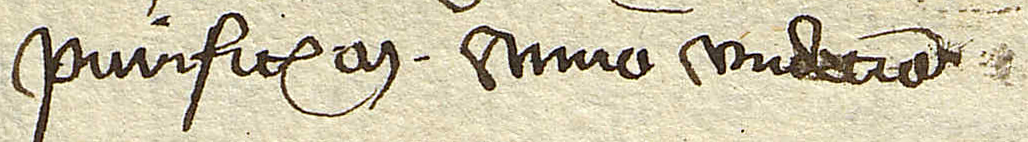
Purific* M . Anno vndecio*
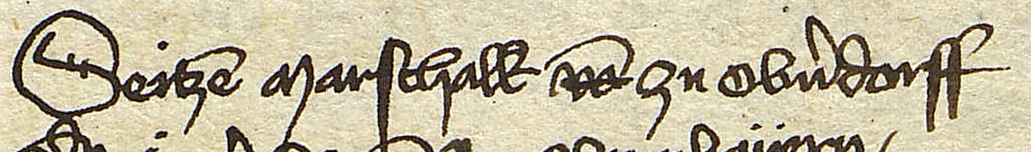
Seitʒe Marſchalk vo cʒu Obn*dorff
